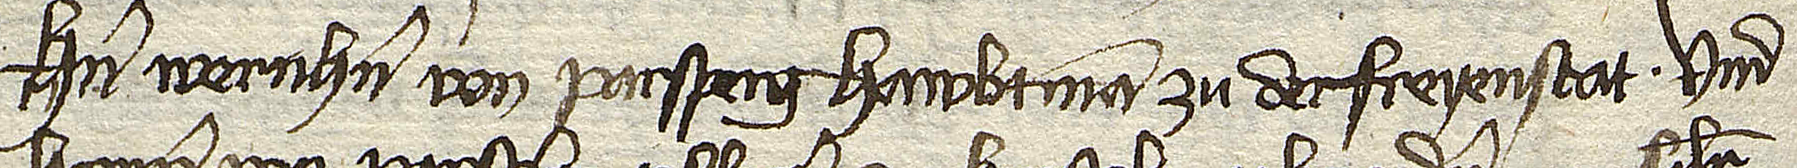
Hn* wernhn* von parſperg hawbtma* ʒu der freyenſtat . Vnd
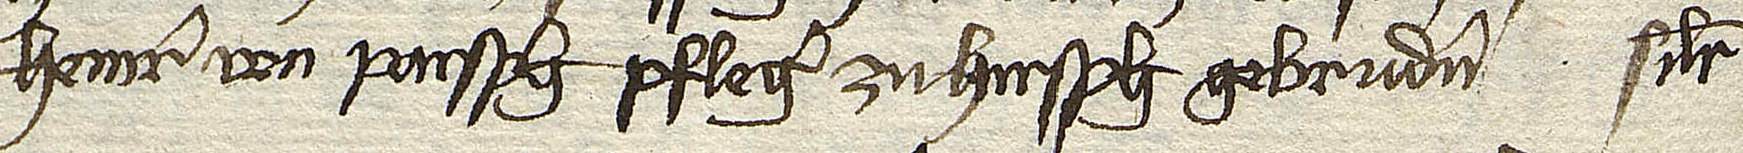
Heinr* von parſp*g pfleg* ʒu hirſp*g gebrudn* . ſilr*
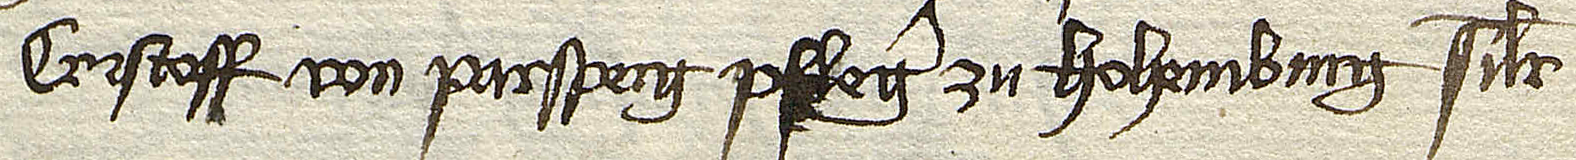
Criſtoff von parſperg pfleg* ʒu Hohemburg ſilr*
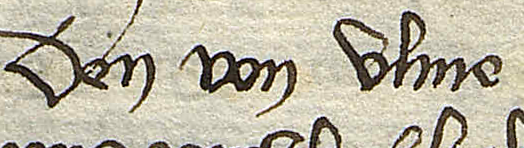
Den von Vlme
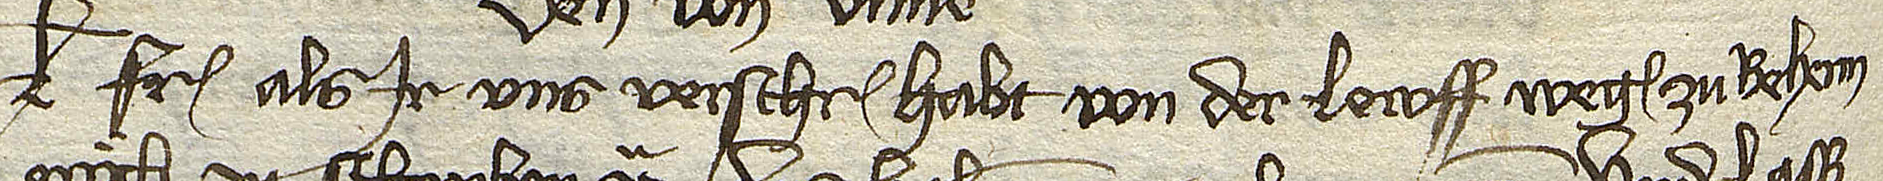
L* fr* als Ir vns verſchr* habt von der lewff weg* ʒu Beheim
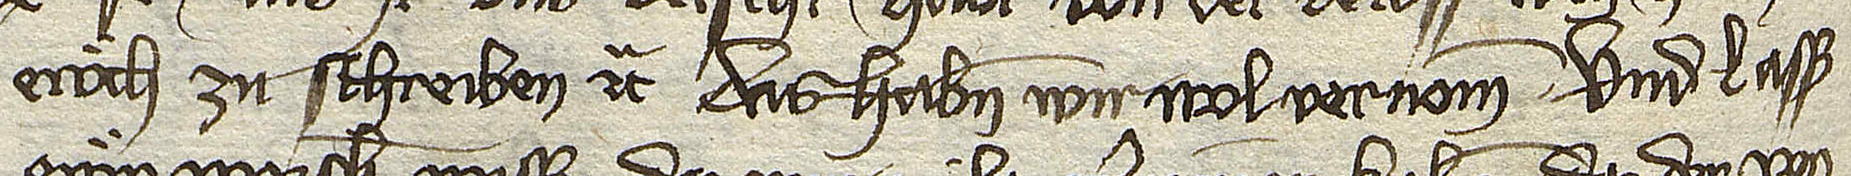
eẅch ʒu ſchreiben ec* Das habn* wir wol vernom* / Vnd laſſ*
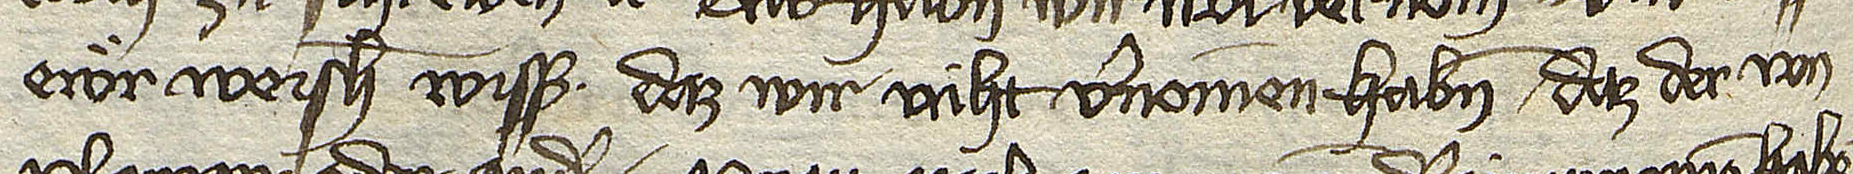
eẅr weiſh* wiſſ* . daʒ wir niht v*nom*en habn* / daʒ der von
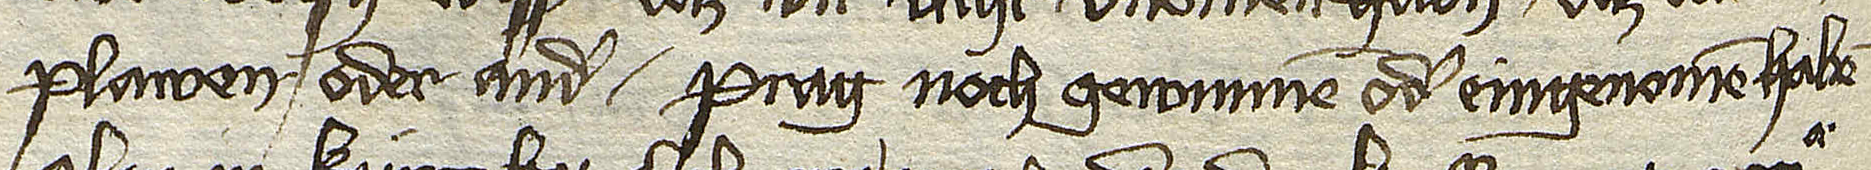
Plawen / oder and* / Prag noch gewunne* od* eingenome* habe*
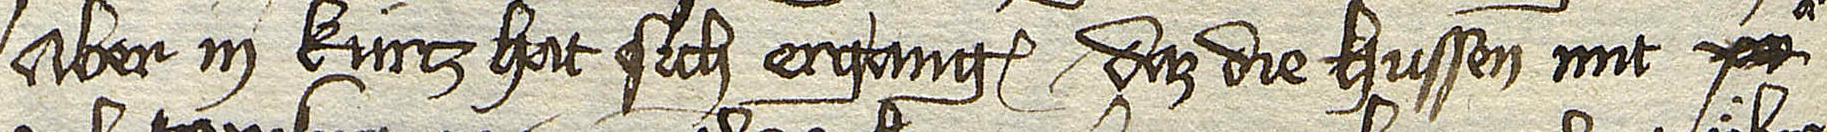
Aber in kürcʒ hat ſich ergang* / Daʒ die huſſen mit xv*
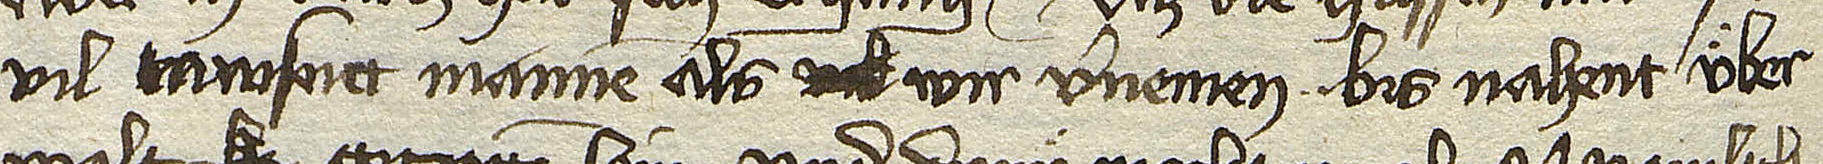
vil tawſent manne* als vil wir v*nemen ~ bis nahent v̈ber
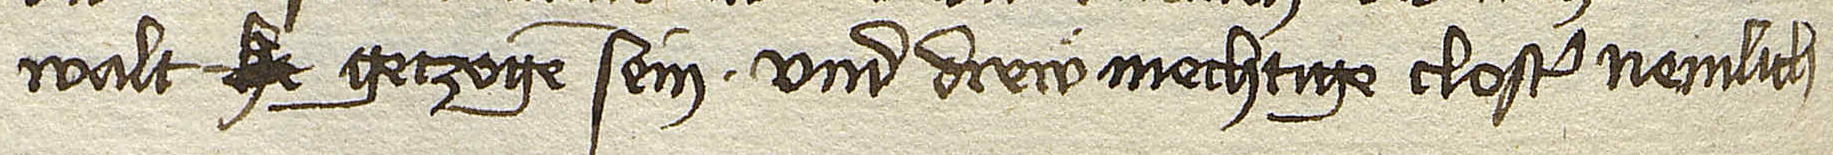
walt h gecʒoge* ſein / vnd dreẅ mechtige cloſt* nemlich
